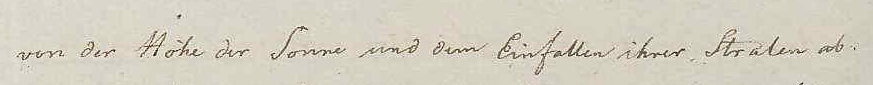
von der Höhe der Sonne und dem Einfallen ihrer Stralen ab.
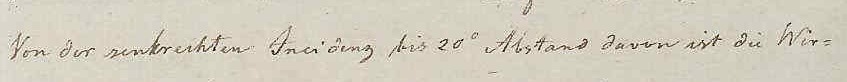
Von der senkrechten Incidenz bis 20° Abstand davon ist die Wir-
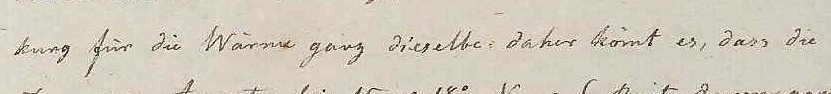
kung für die Wärme ganz dieselbe: daher kömt es, dass die
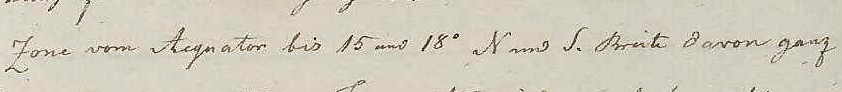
Zone vom Aequator bis 15 und 18° NN.- und S. S.-Breite davon ganz
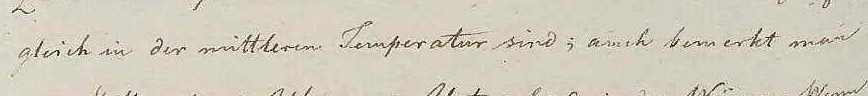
gleich in der mittleren Temperatur sind; auch bemerkt man
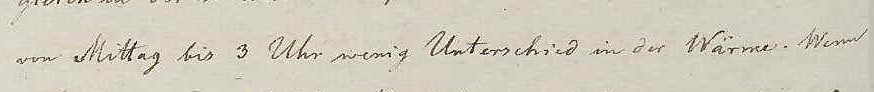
von Mittag bis 3 Uhr wenig Unterschied in der Wärme. Wenn
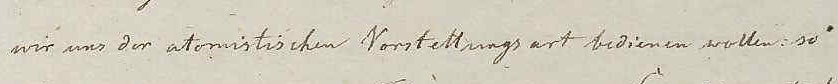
wir uns der atomistischen Vorstellungsart bedienen wollen: so
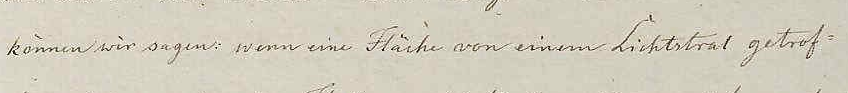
können wir sagen: wenn eine Fläche von einem Lichtstral getrof-
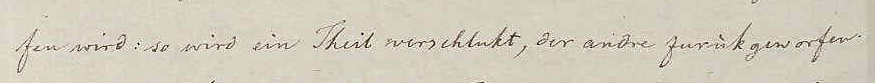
fen wird: so wird ein Theil verschlukt, der andre zurükgeworfen.
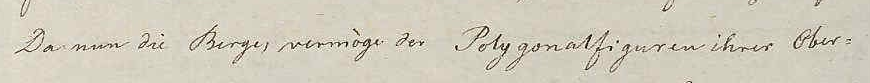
Da nun die Berge, vermöge der Polygonalfiguren ihrer Ober-
